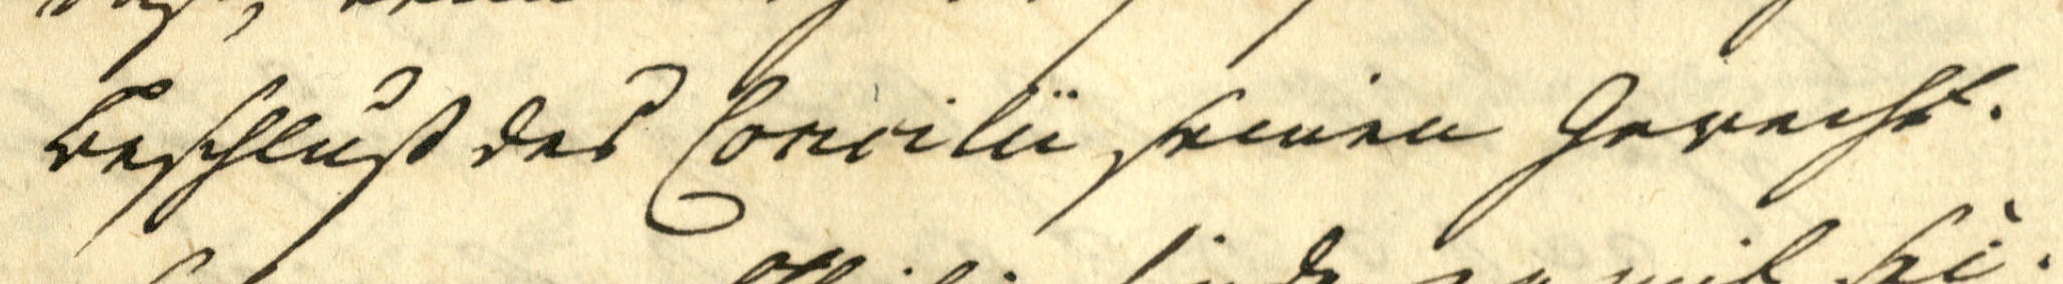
Beschluß des Concilii seinen Gerecht¬
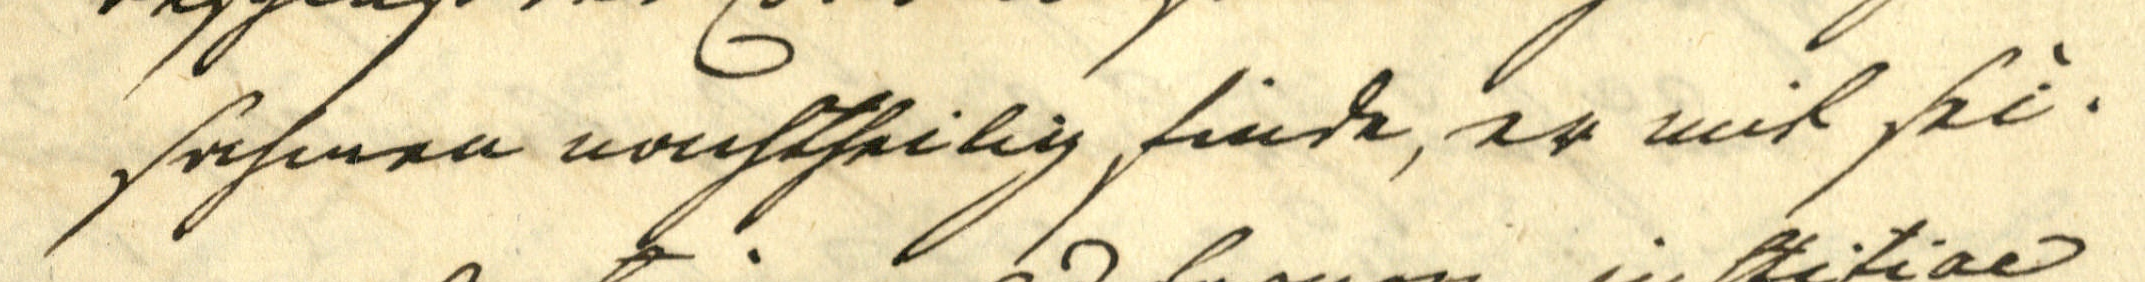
sahmen nachtheilig finde, er mit sei¬
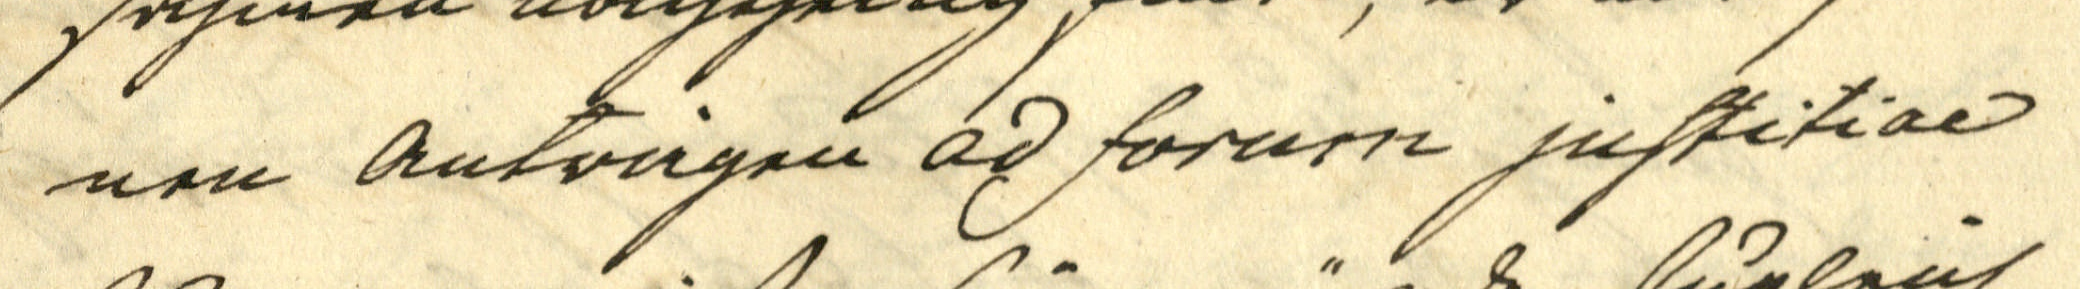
nen Anträgen ad Forum justitiae
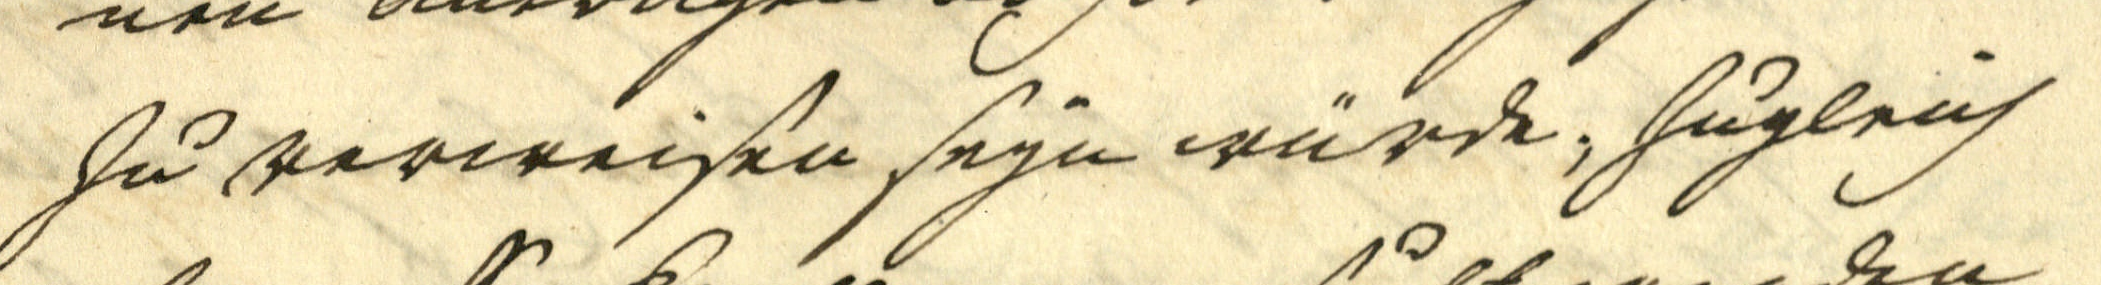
zu verweisen seÿn würde; Zugleich
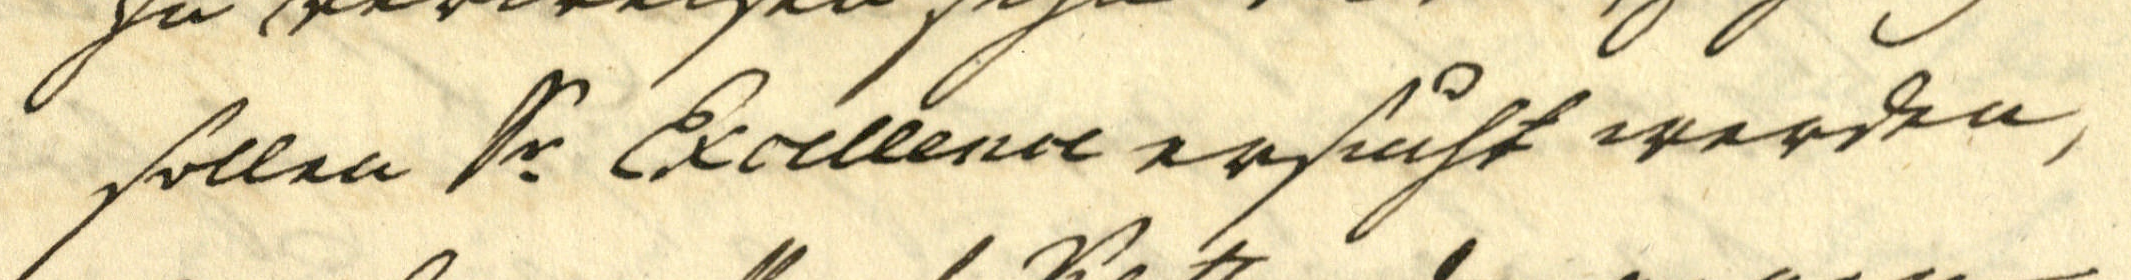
sollen Sr Excellence ersucht werden,
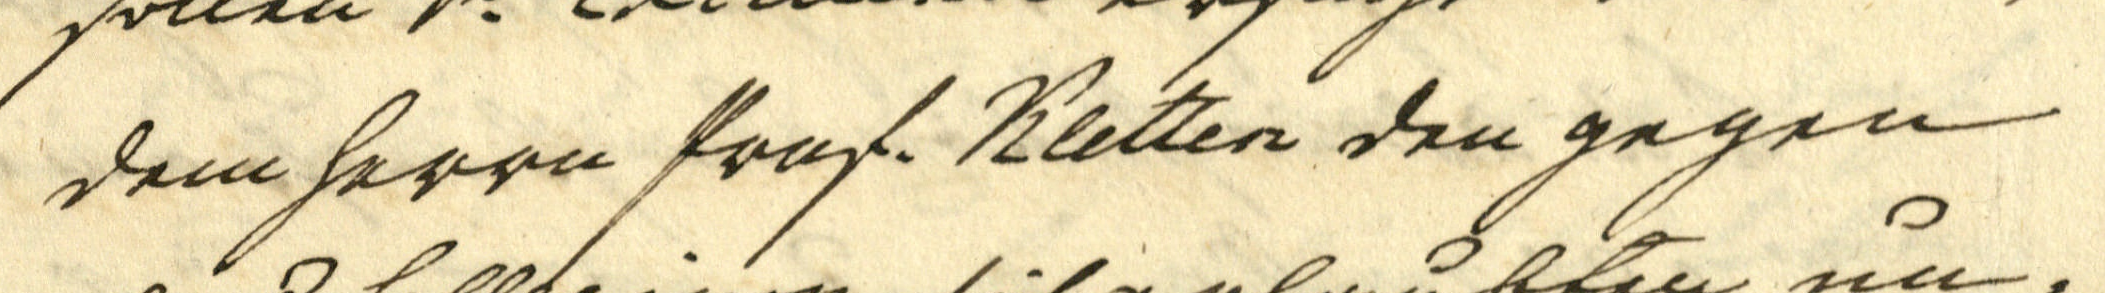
dem Herrn Prof. Kletten den gegen
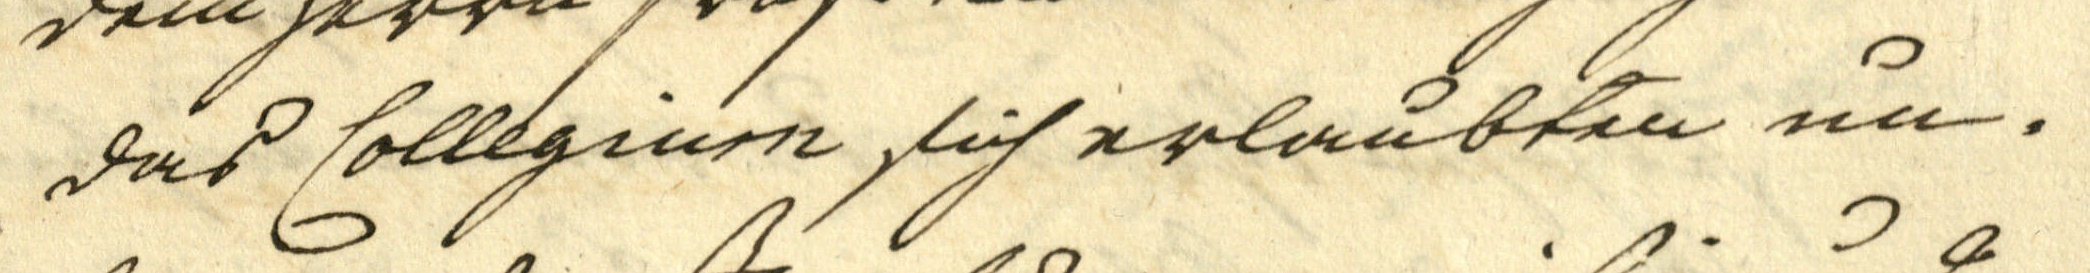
das Collegium sich erlaubten un¬
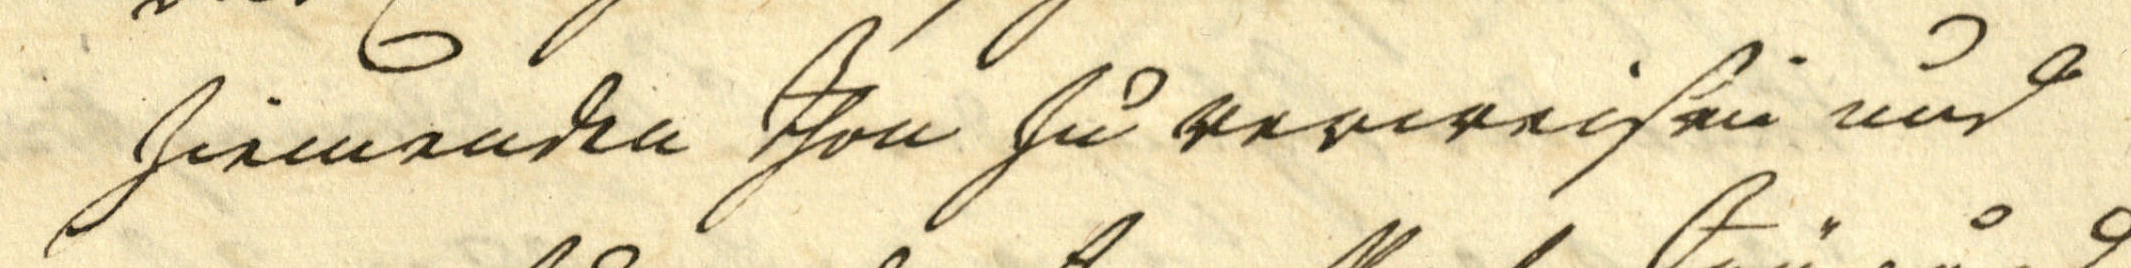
ziemenden Thon zu verweisen und
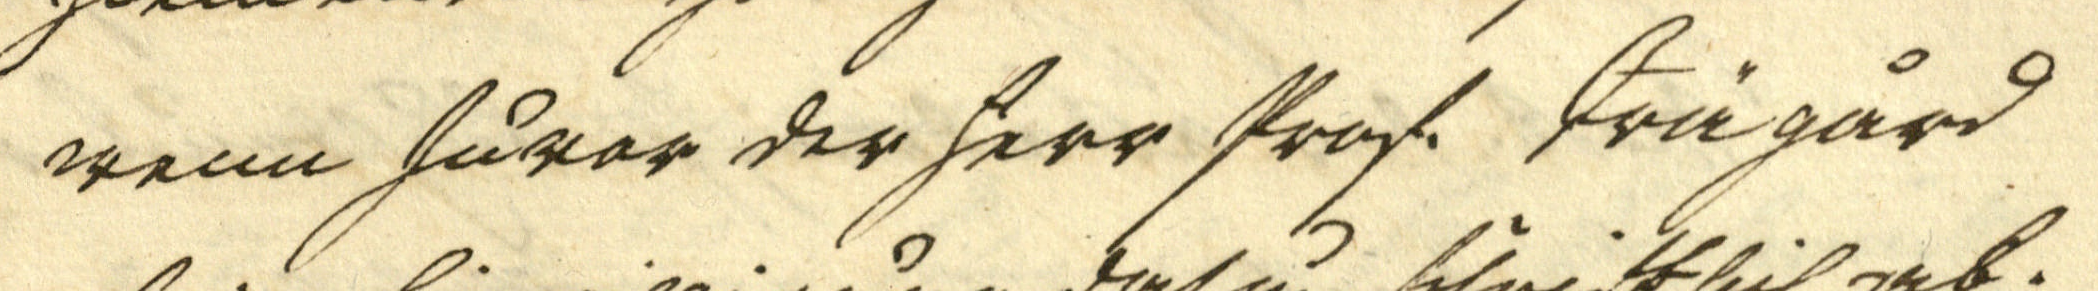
wenn zuvor der Herr Prof. Trägard
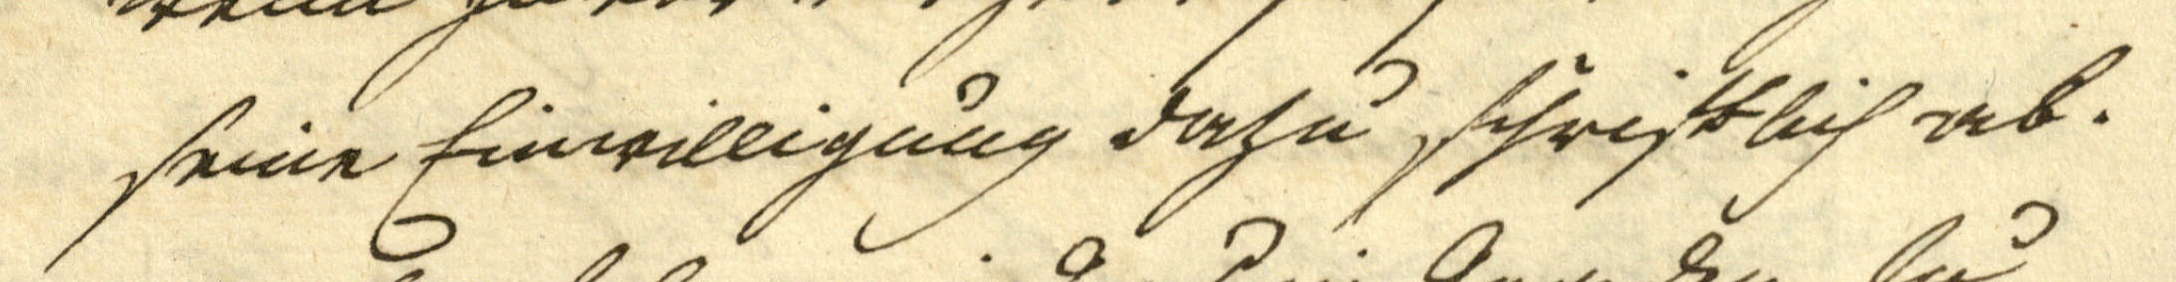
seine Einwilligung dazu schriftlich ab¬
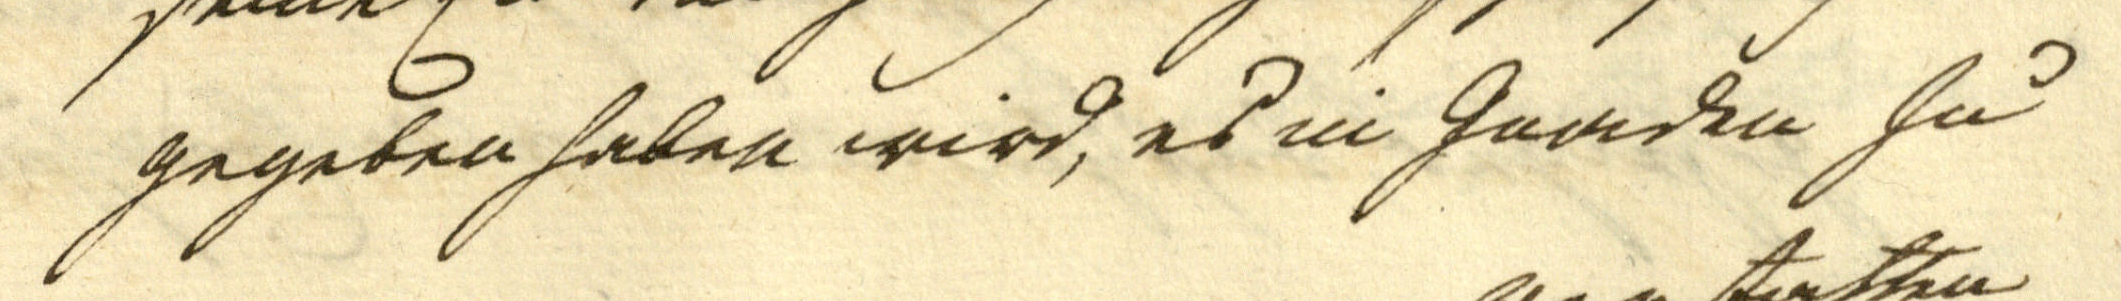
gegeben haben wird, es in Gnaden zu
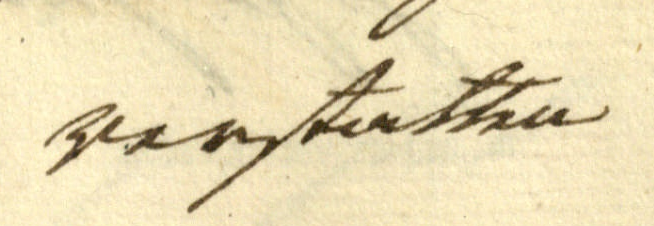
verstatten
